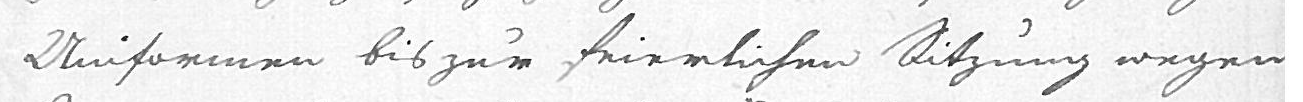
Uniformen bis zur feierlichen Sitzung wegen
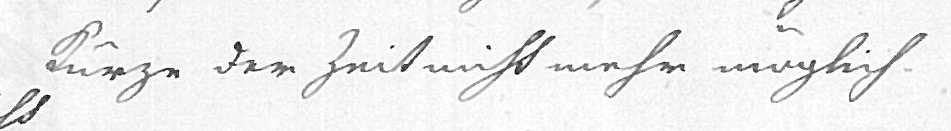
Kürze der Zeit nicht mehr möglich.
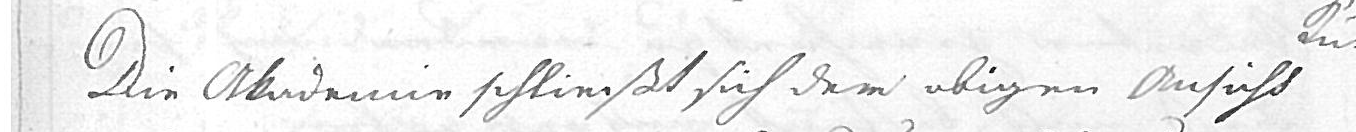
Die Akademie schließt sich der obigen Ansicht
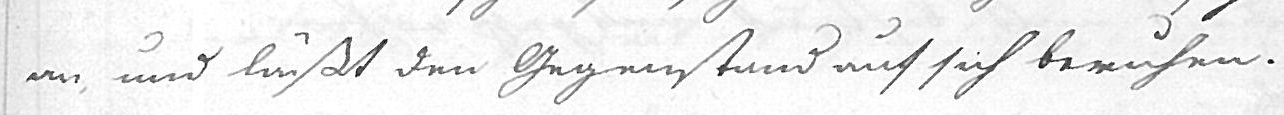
an und läßt den Gegenstand auf sich beruhen.
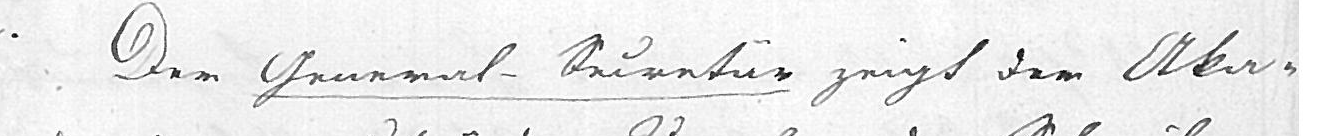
Der General-Secretär zeigt der Aka-
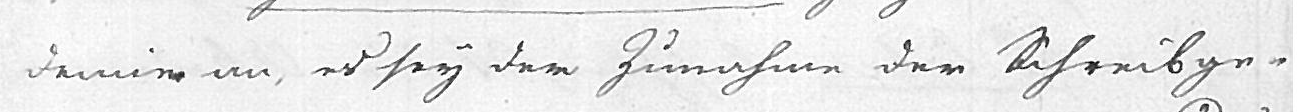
demie an, es sey der Zunahme der Schreibge-
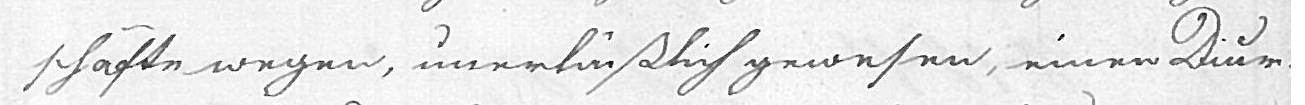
schäfte wegen, unerläßlich gewesen, einen Diur-
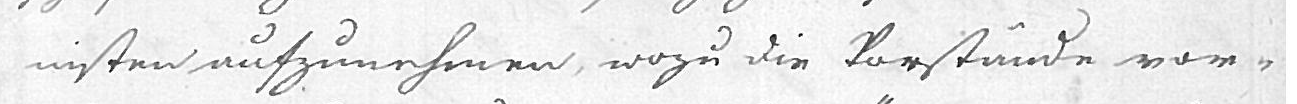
nisten aufzunehmen, wozu die Vorstände vor-
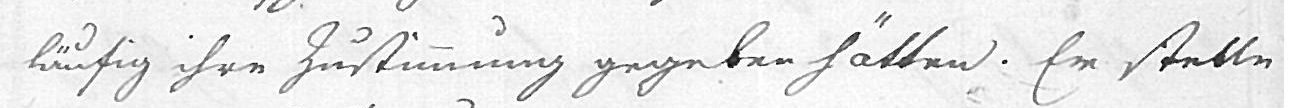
läufig ihre Zustimmung gegeben hätten. Er stelle
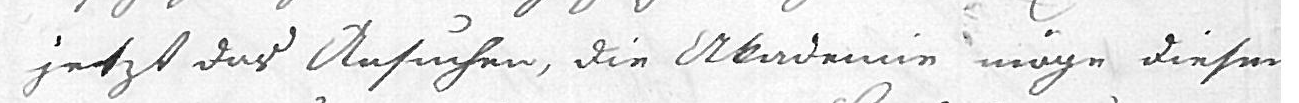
jetzt das Ansuchen, die Akademie möge diesen
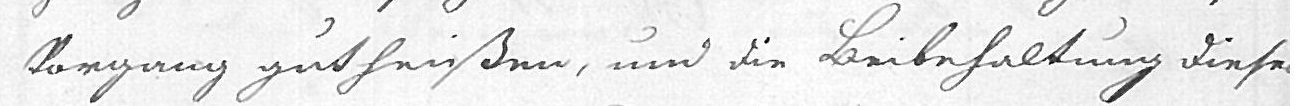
Vorgang gutheißen, und die Beibehaltung dieses
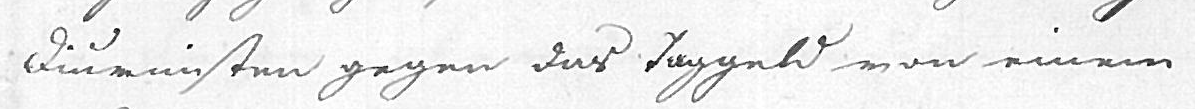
Diurnisten gegen das Taggeld von einem
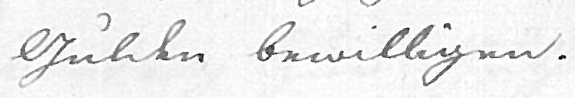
Gulden bewilligen.
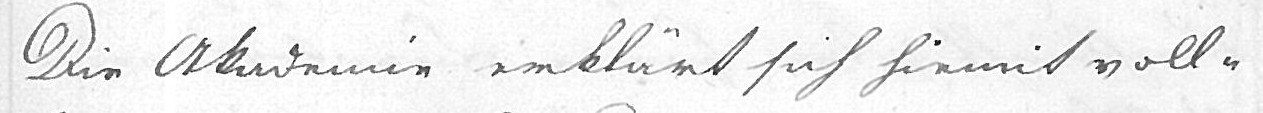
Die Akademie erklärt sich hiemit voll-
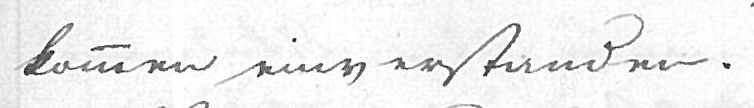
kommen einverstanden.
